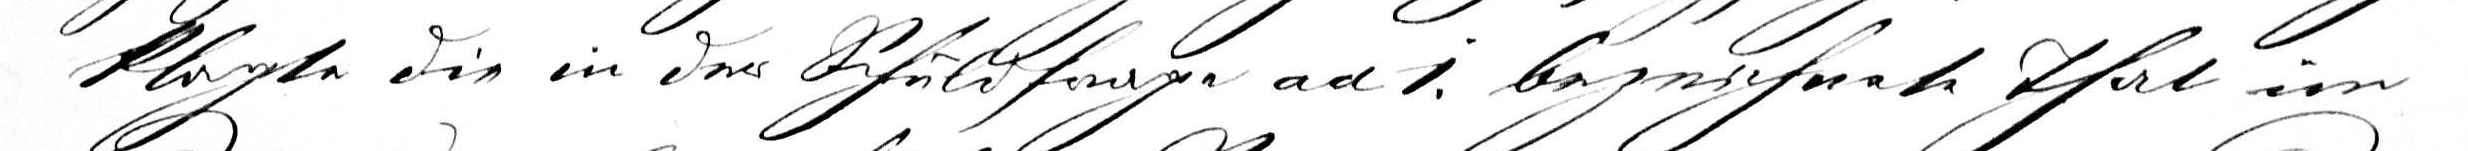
klagte die in der Schuldfrage ad 1. bezeichnete That im
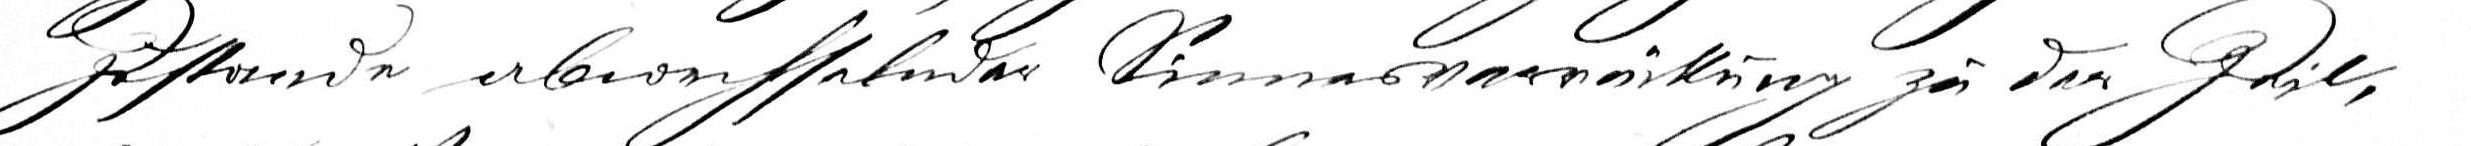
Zustande abwechselnder Sinnesverrückung zu der Zeit,
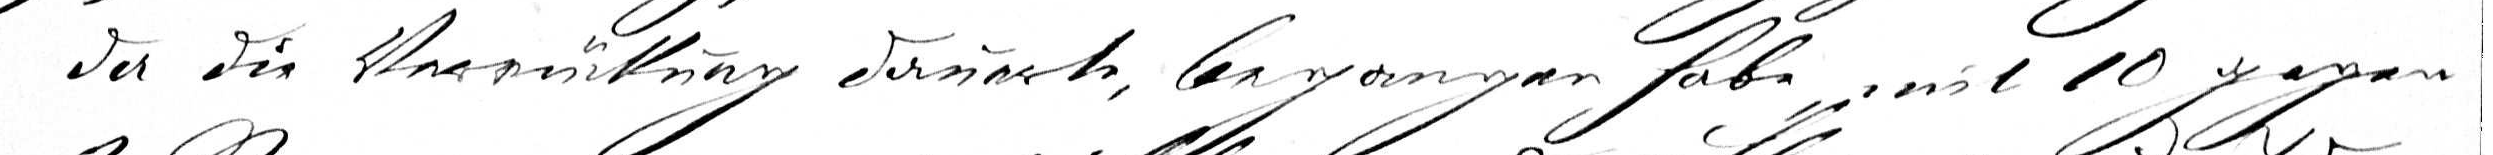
da die Verrückung dauerte, begangen habe, mit 10 gegen
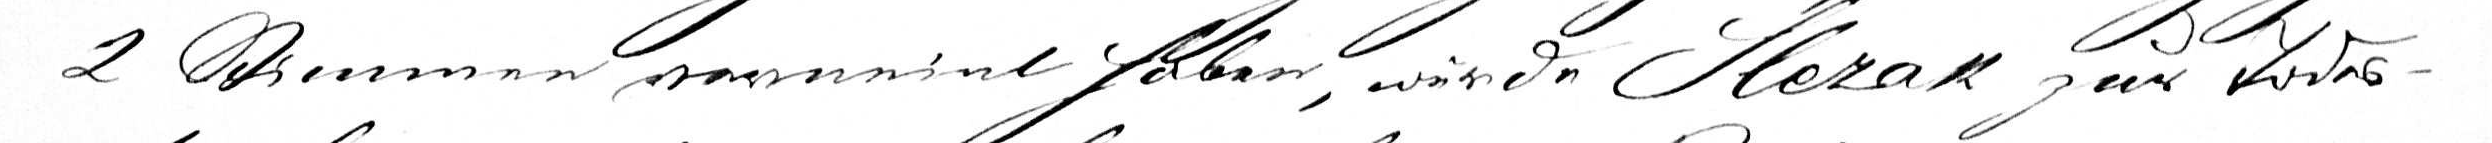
2 Stimmen verneint haben, wurde Slezak zur Todes¬
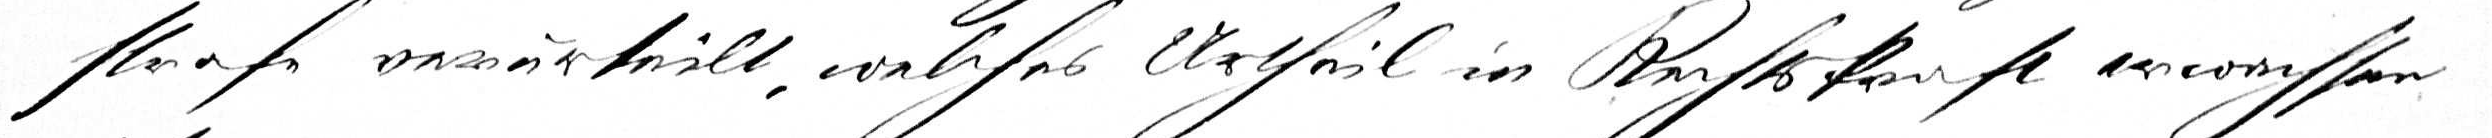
strafe verurteilt, welches Urtheil in Rechtskraft erwachsen
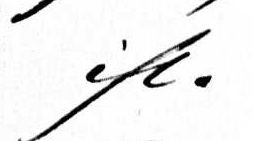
ist.
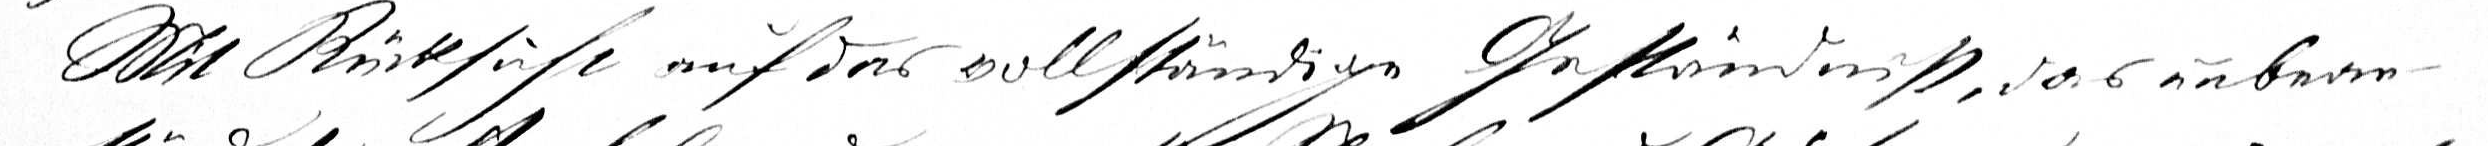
Mit Rücksicht auf das vollständige Geständniß, das unbean¬
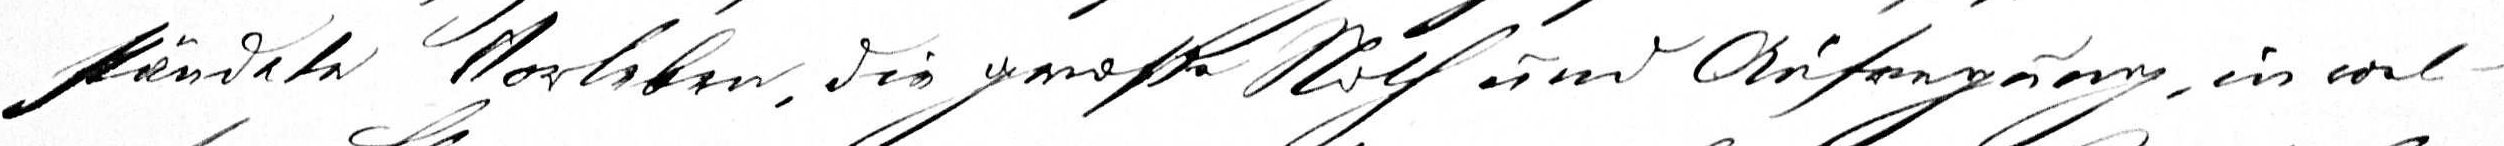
ständete Vorleben, die große Noth und Aufregung, in wel¬
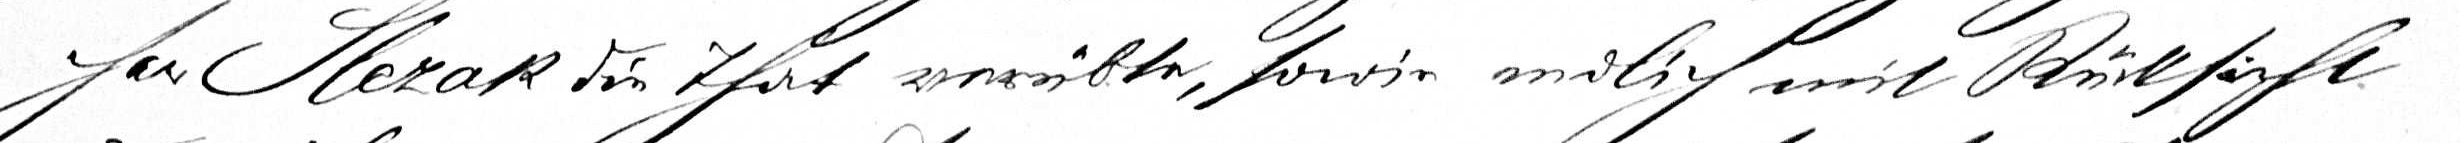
cher Slezak die That verübte, sowie endlich mit Rücksicht
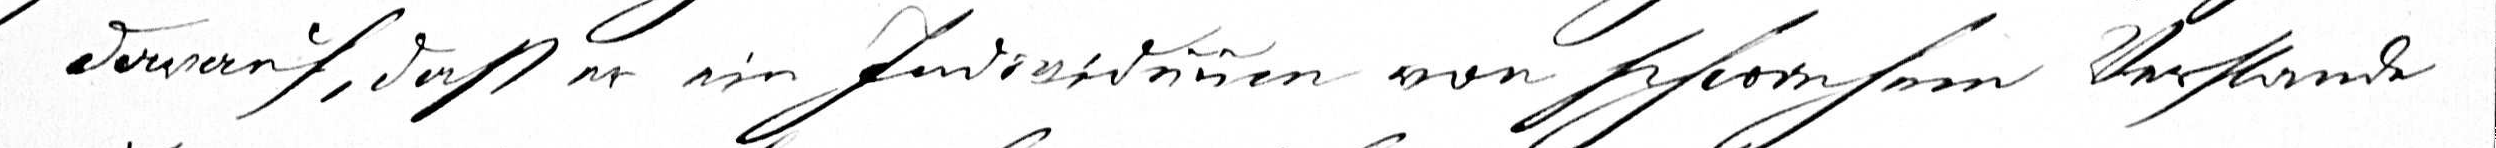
darauf, daß er ein Jndividuum von schwxx Verstande
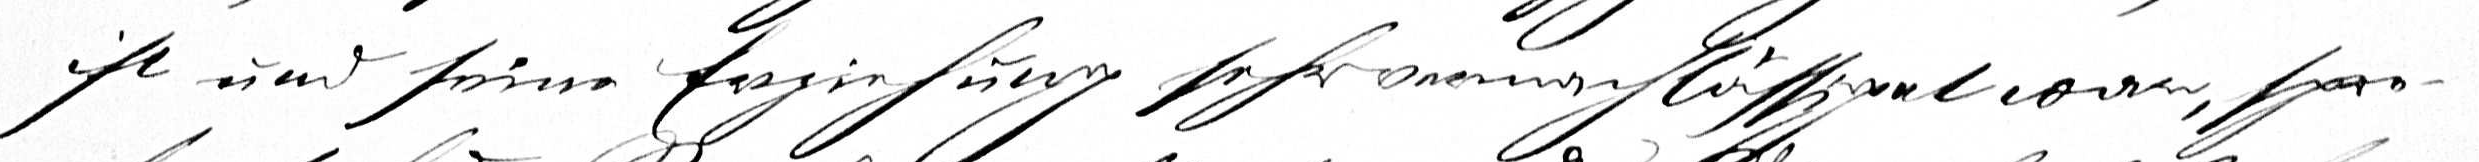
ist und seine Erziehung sehr vernachlässiget war, spre¬
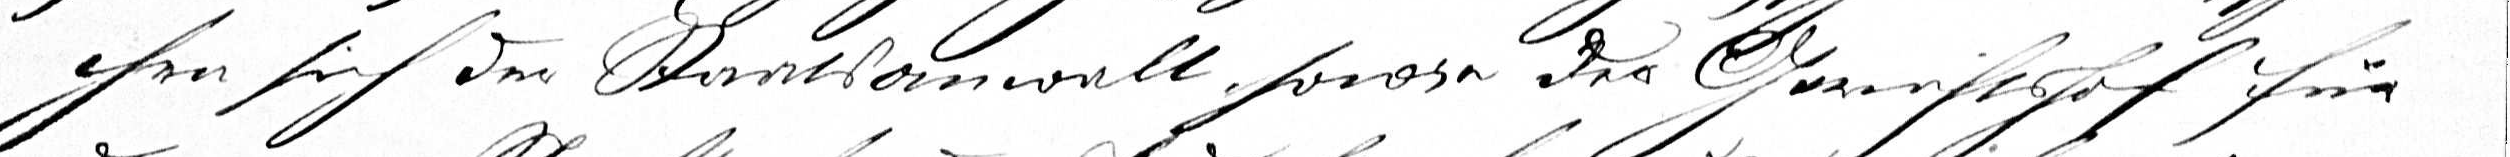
chen sich der Staatsanwalt sowie der Gerichtshof für
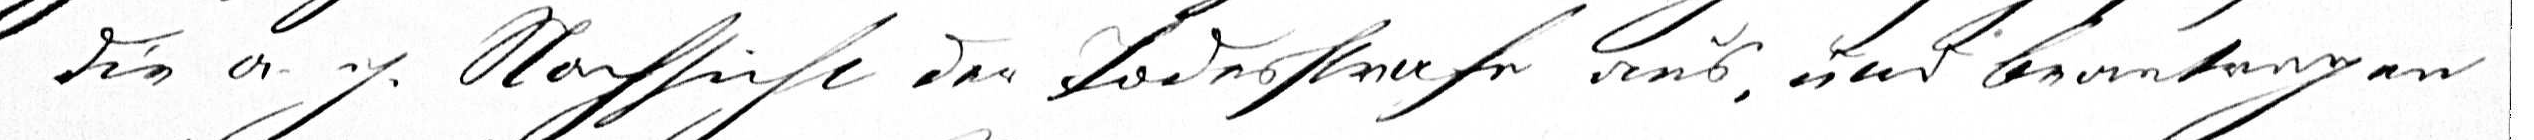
die a. g. Nachsicht der Todesstrafe aus, und beantragen
